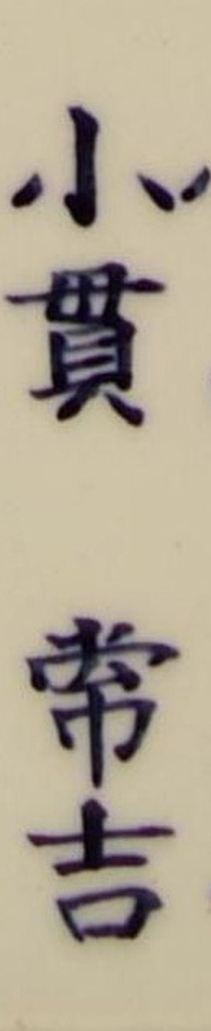小貫常吉
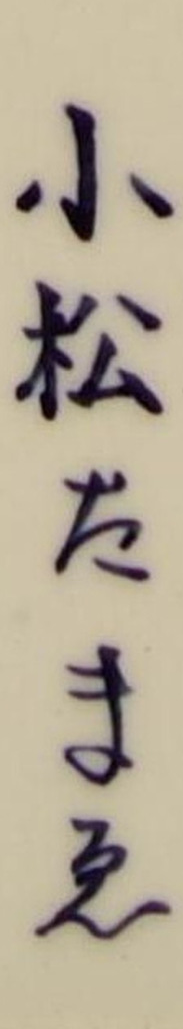小松たまえ
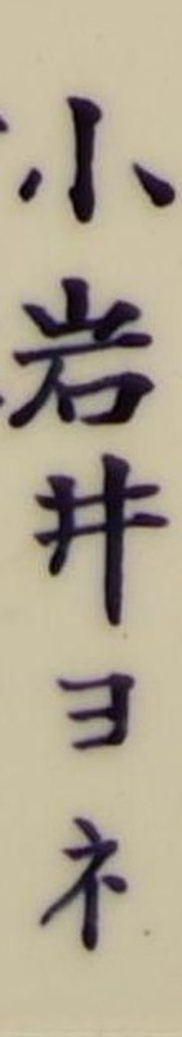小岩井ヨネ
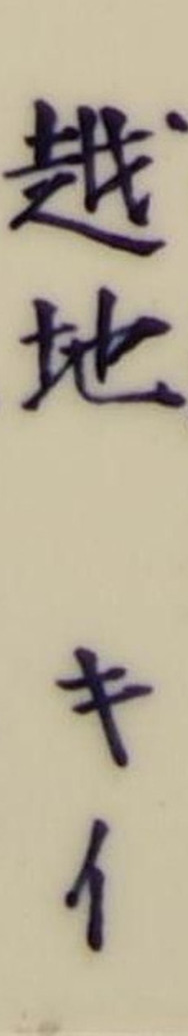越地キイ
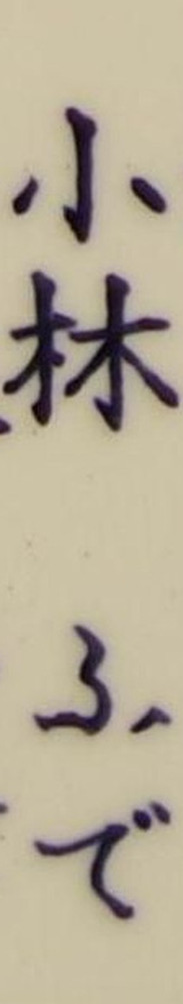小林ふで
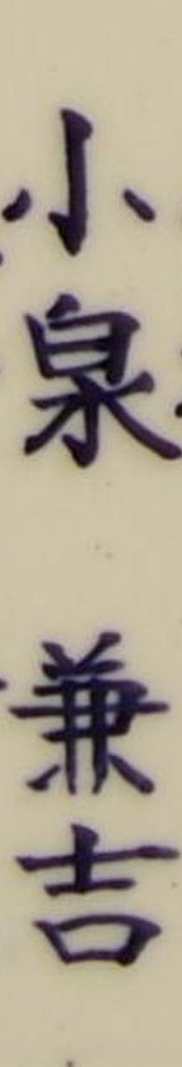小泉兼吉
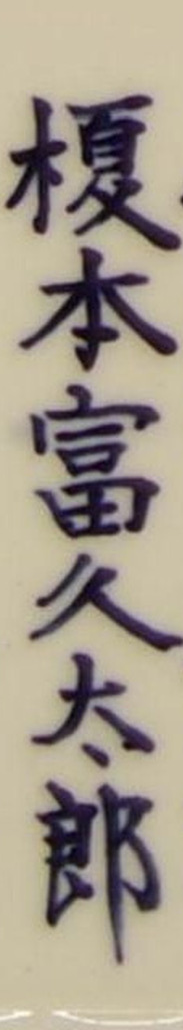榎本富久太郎

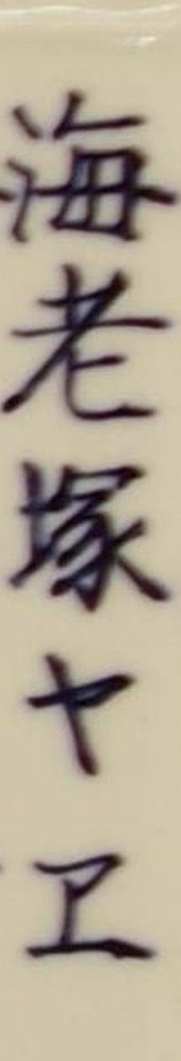海老塚ヤエ
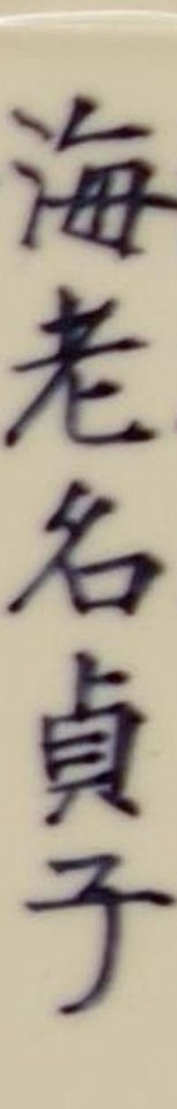海老名貞子
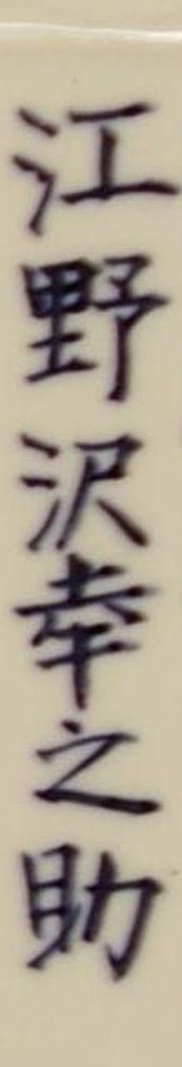江野沢幸之助
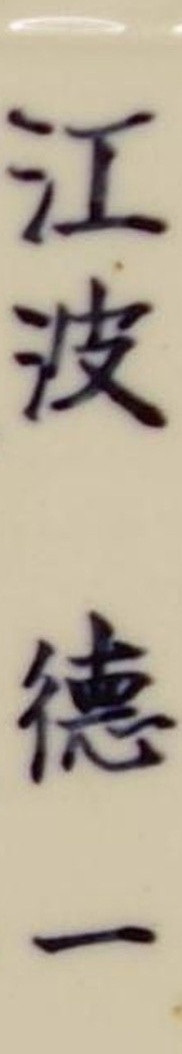江波徳一
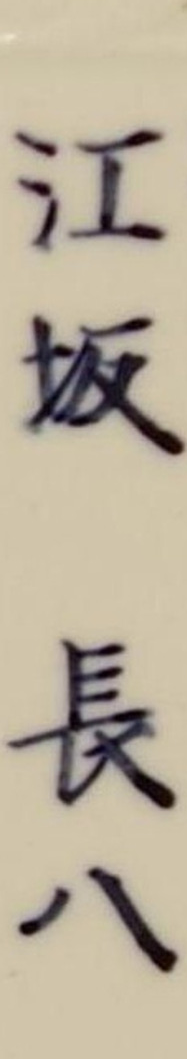江坂長八
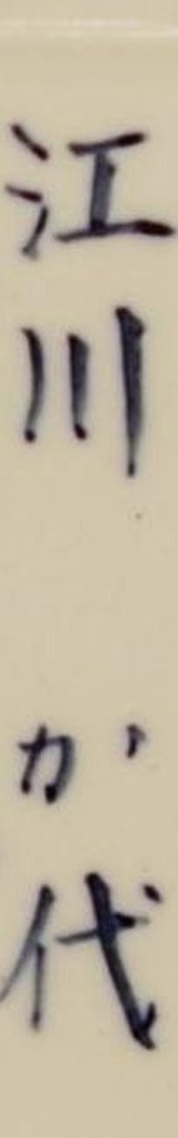江川か代
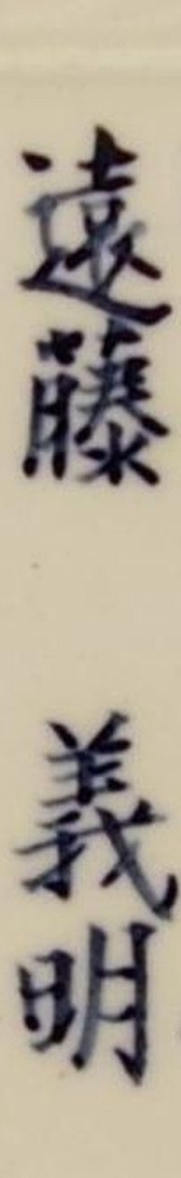遠藤義明
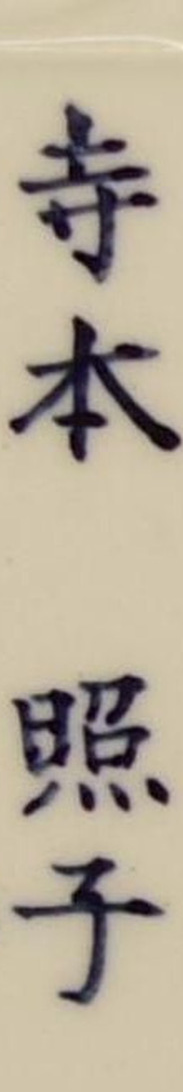寺本照子
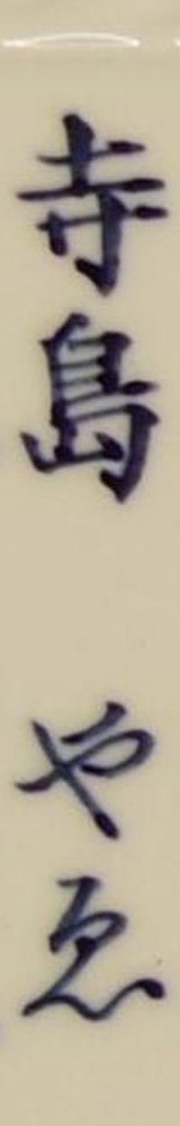寺島やえ
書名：E~L
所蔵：高野山金剛峯寺
